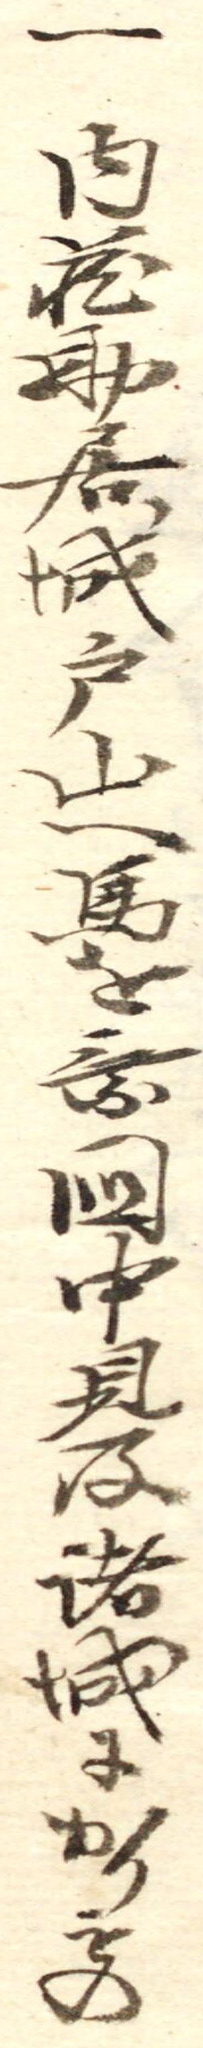一内蔵助居城戸山へ馬を糊乗国中見及諸城尓かりもの
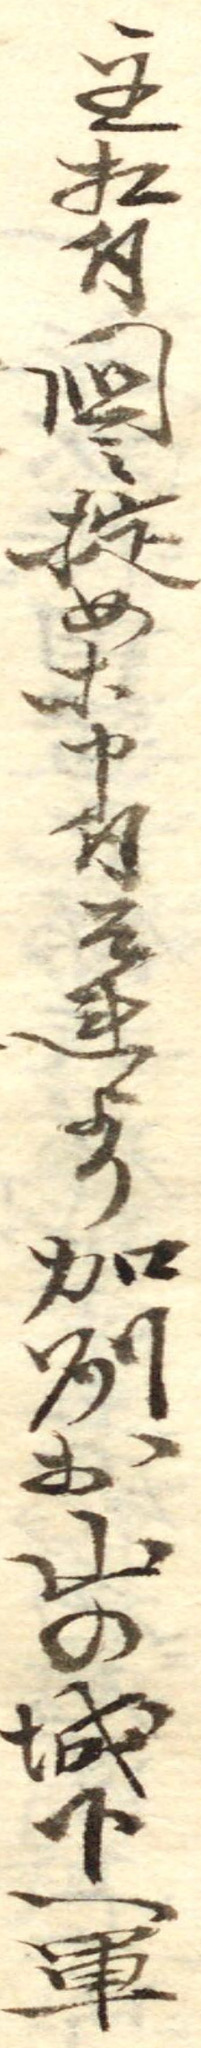主相付国之掟め等申付そ連より加州お山の城下へ軍
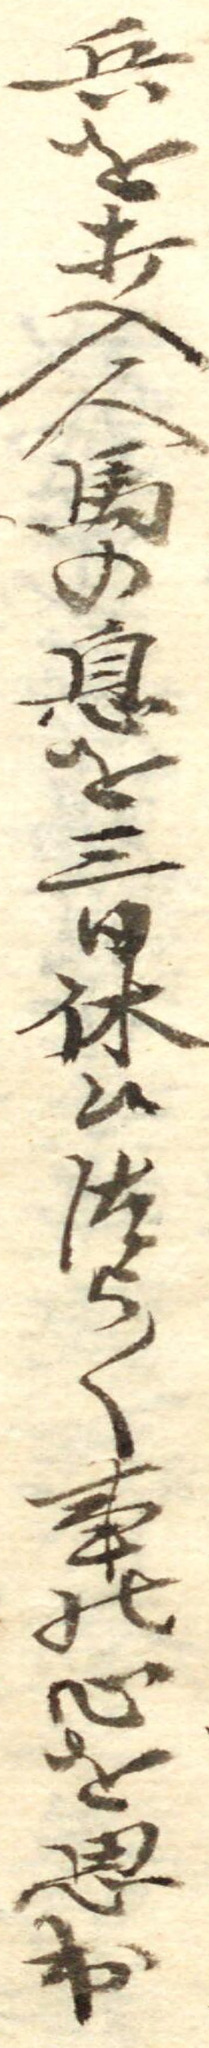兵を打入人馬の息を三日休候徒ら〳〵事能心を思出
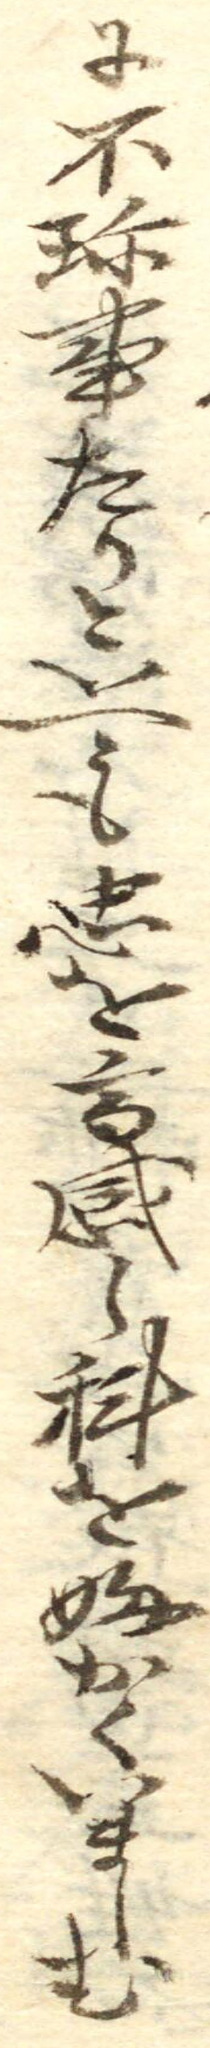尓不珍事たりといへとも忠を高感し科を婦かくいましむ
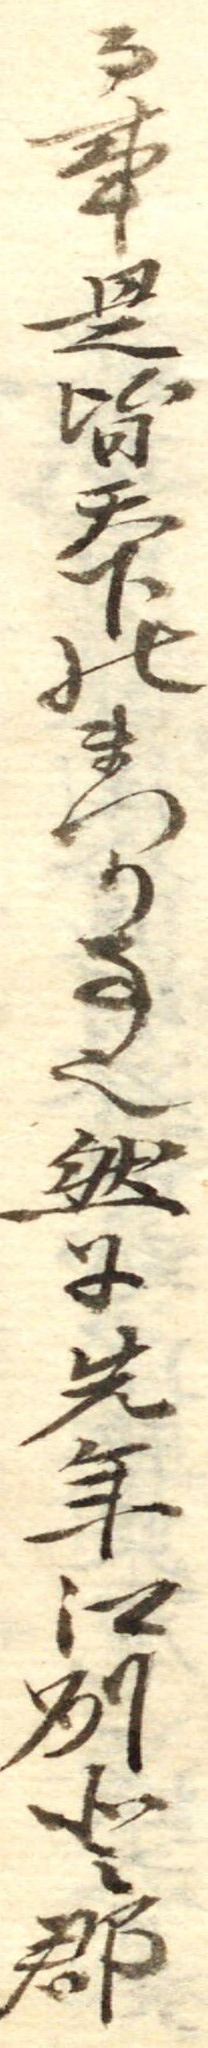る事是皆天下能まつり事也然尓先年江州登郡
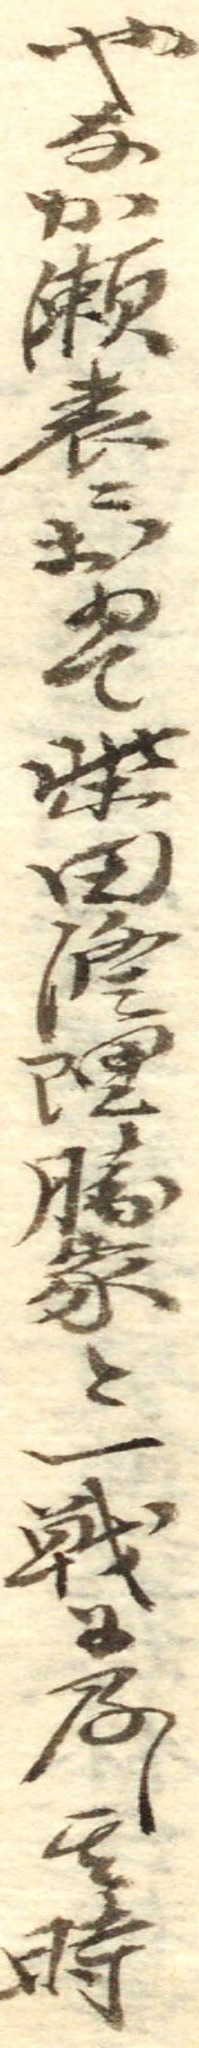やなか瀬表におゐて柴田修理勝家と一戦尓及し其時
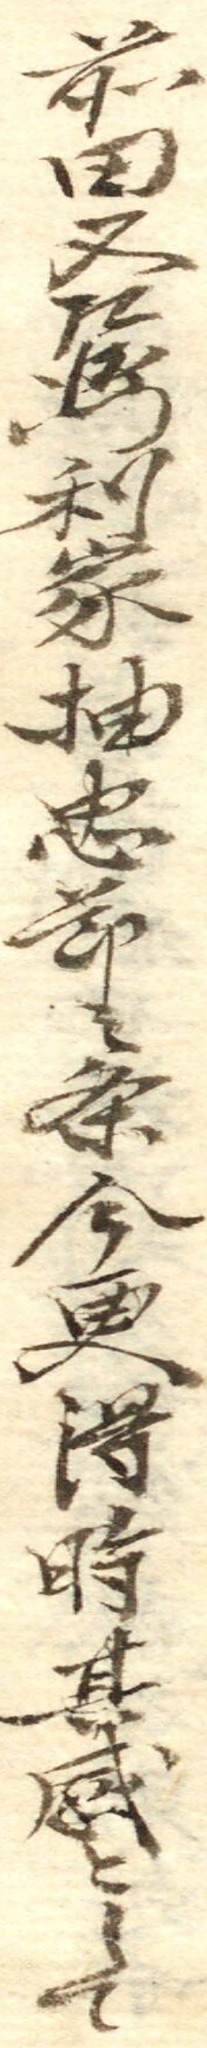前田又左衛門利家忠忠節之条今更得時其感として
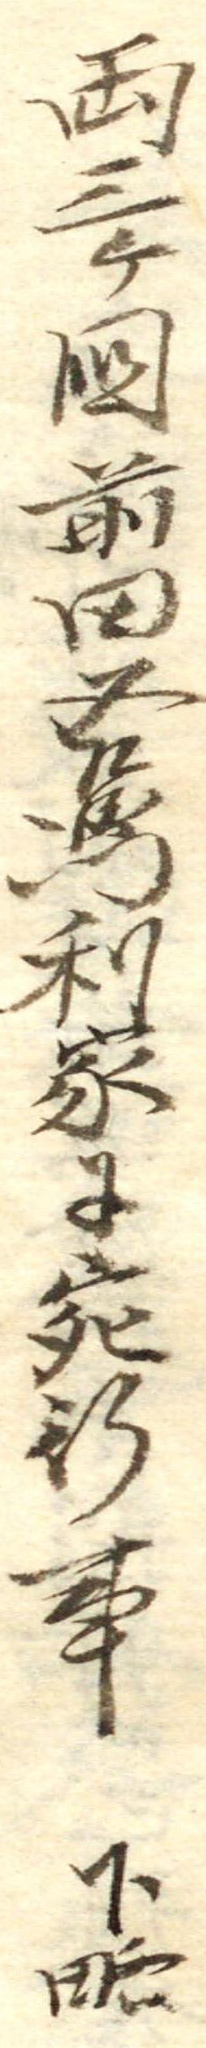両三け国前田又左衛門利家尓宛行事下略
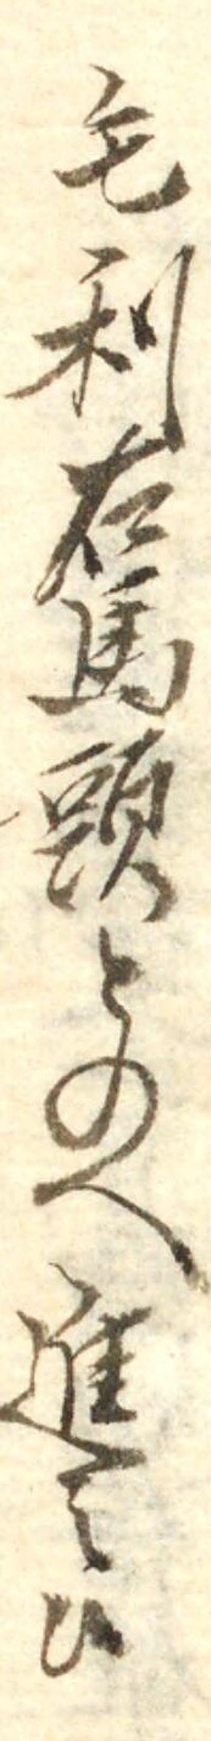毛利右馬頭とのへ進之候

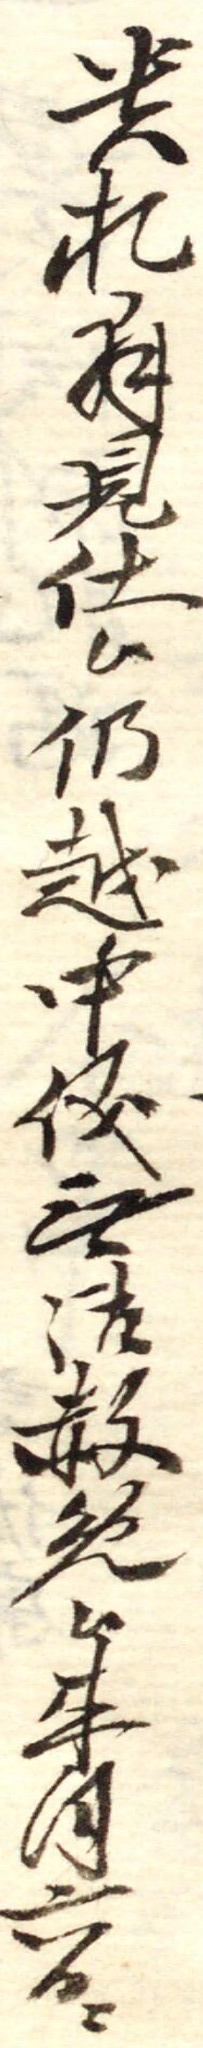貴札拝見仕候仍越中儀無請赦免候来月六日に
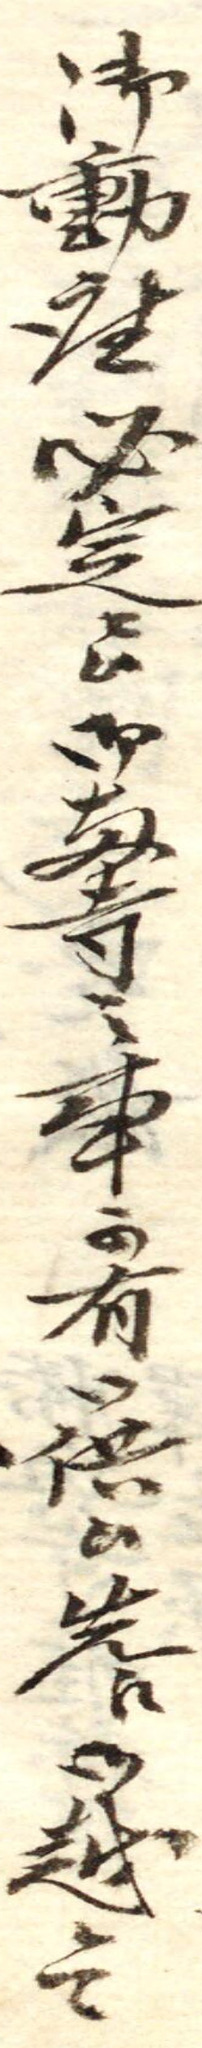御動座必定に候御両寺之事可有御供候先江御越候て
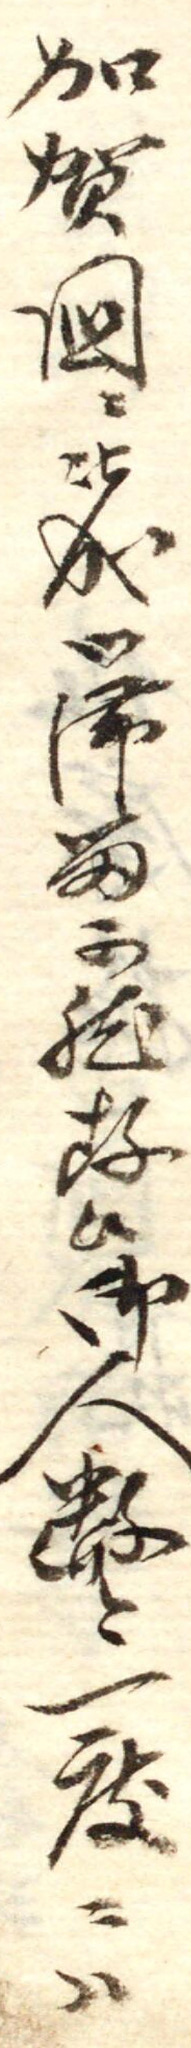加賀国に被成御滞留可然存候御人数と一度には
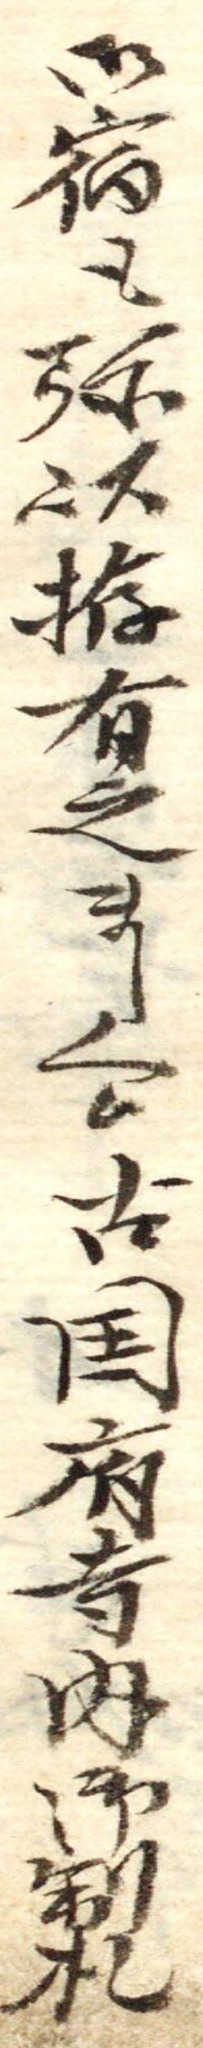御宿も弥以拵有之ましく候古国府寺内御制札
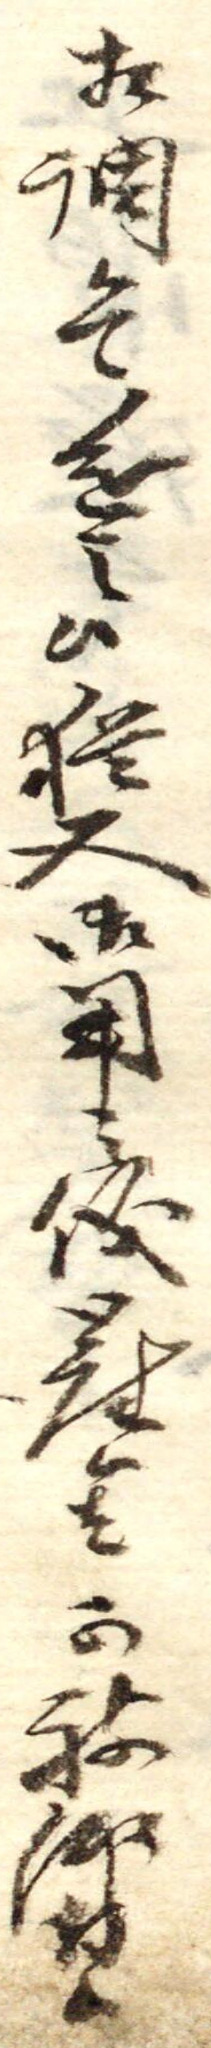相調候て進之候猶又御用之儀御座候者可被仰付候

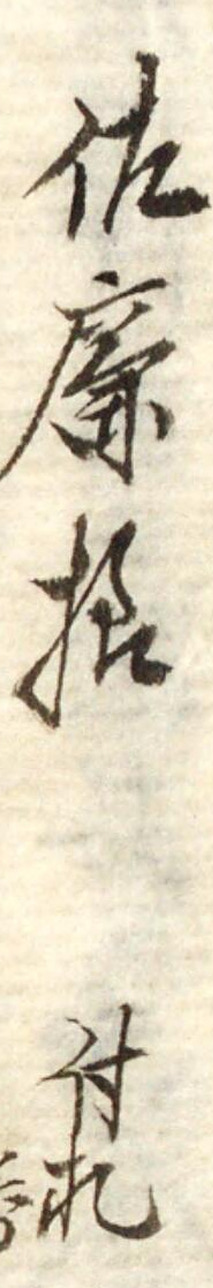佐廉様付札
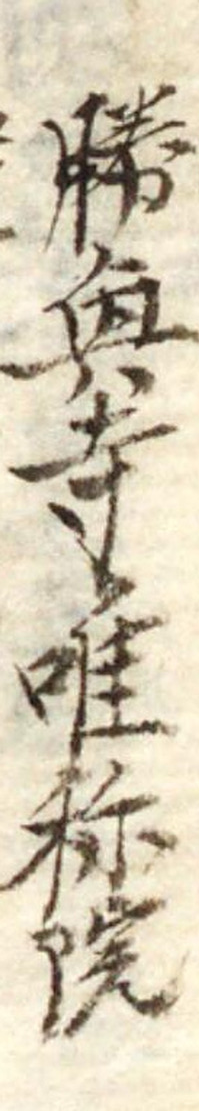其報勝興寺唯称院
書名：前田家封国証書集録
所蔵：Ishikawa Prefectural Library
